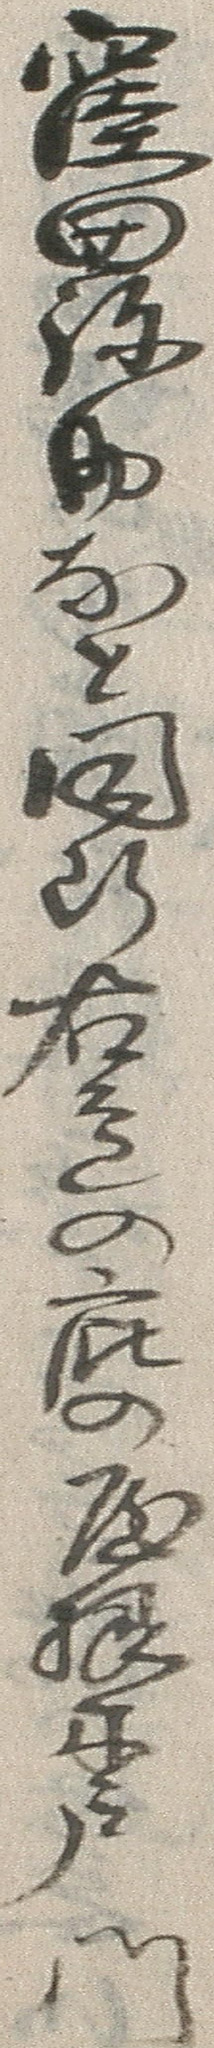窪田弥助なと同断右辺の庇の屋根木戸門
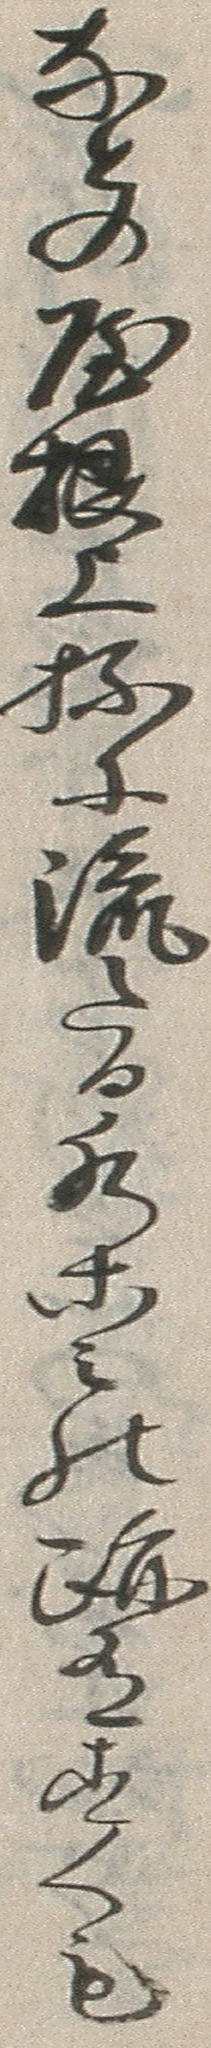なとの屋根上抔に流たる水こみの跡有すくも
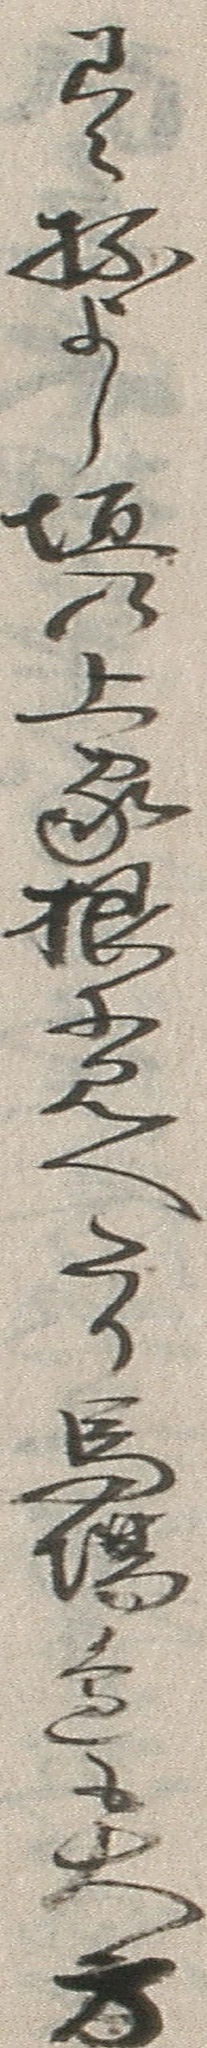わら抔よし垣の上家根に見へたり馬場辺も大方
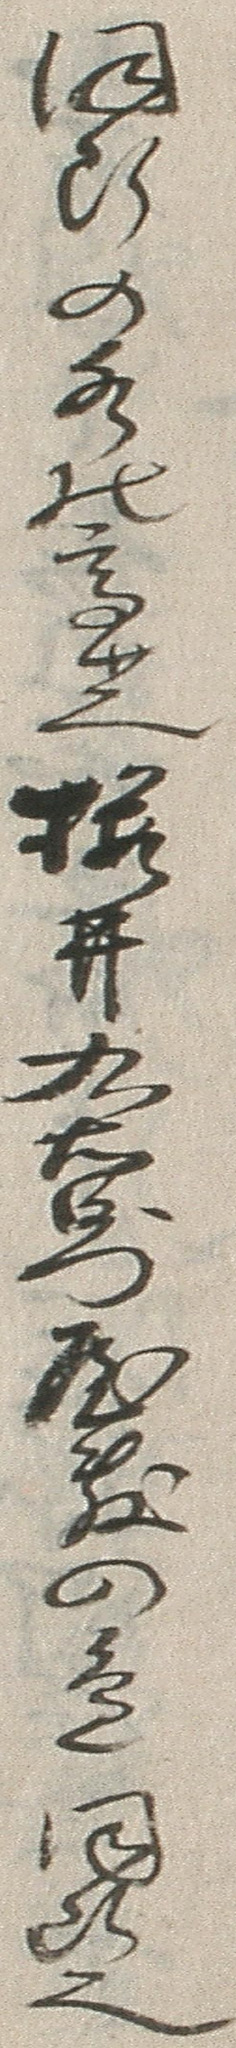同断の水の高サ也桜井九右衛門屋敷の辺同断也
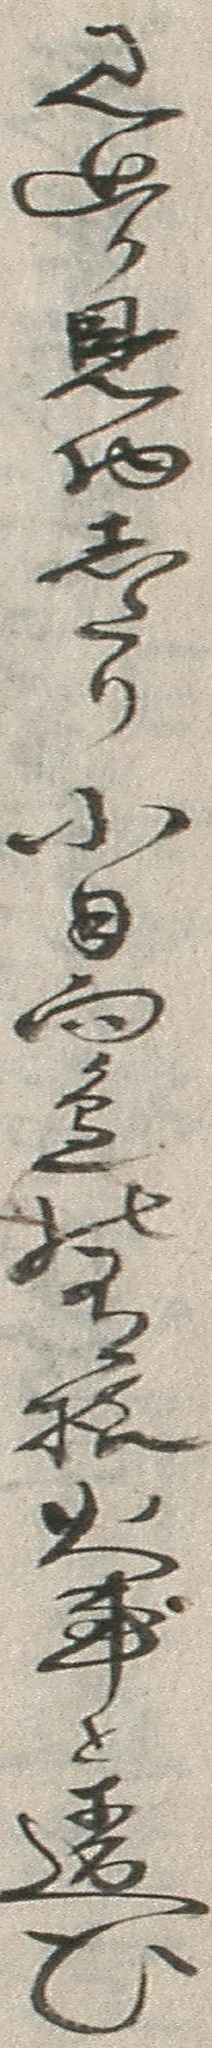見廻り見物したり小日向辺の有様火事と違ひ
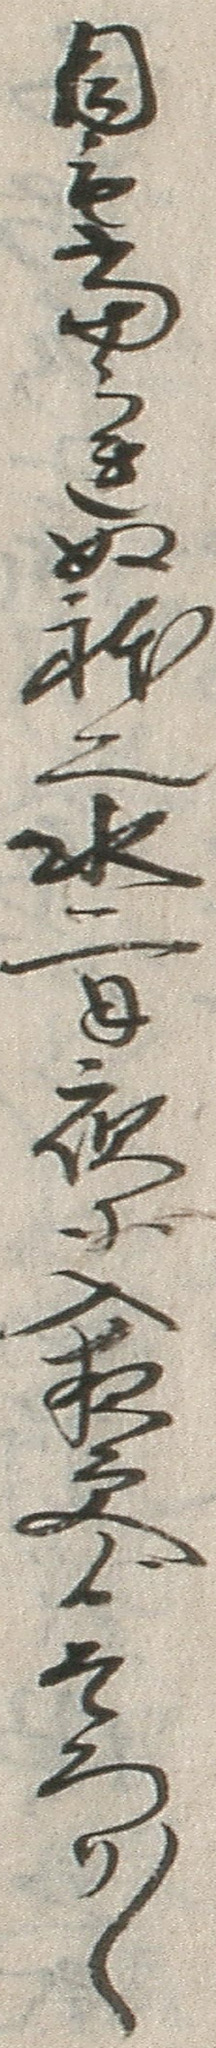目も当られぬ躰也水二日夜に入夜更ゟそろり〳〵
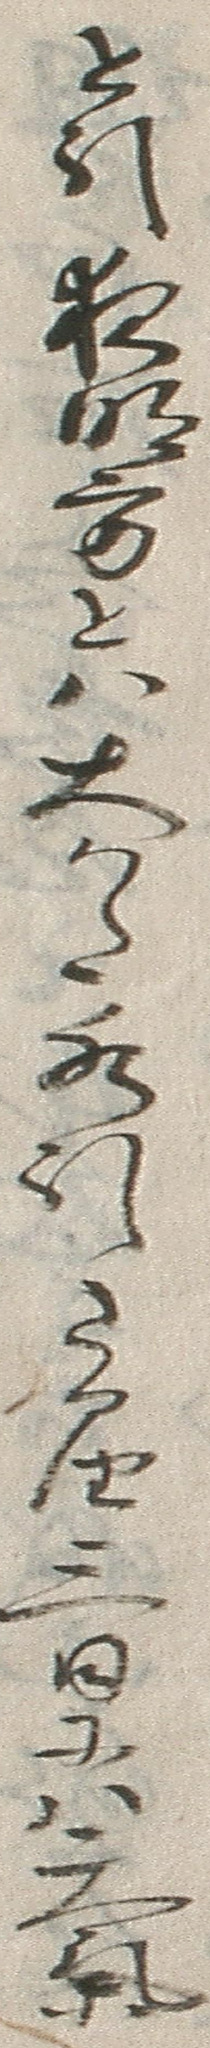と引夜明方とは大かた水引たる由三日には天気
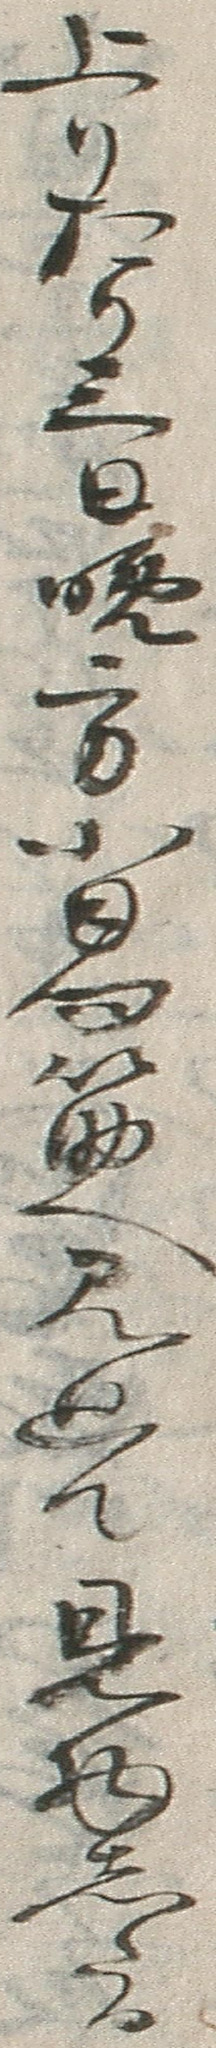上りたり三日晩方小日向筋へ見廻て見物したる
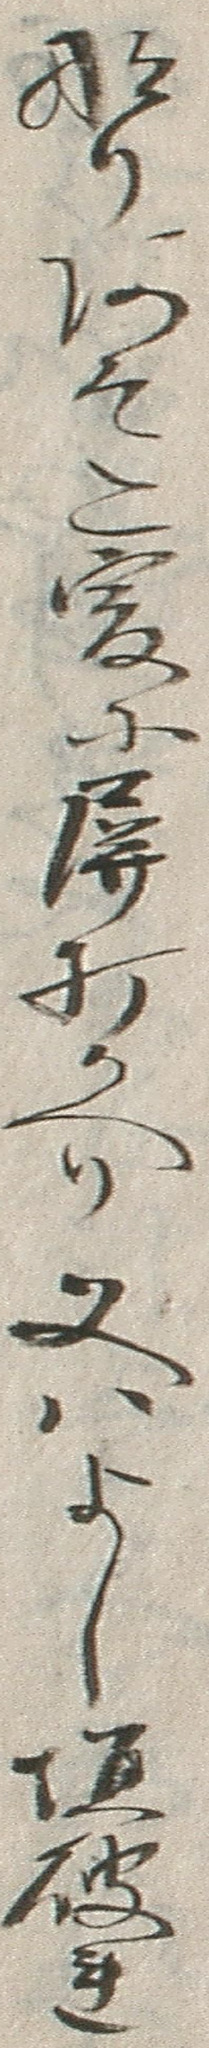なりあそこ爰に屏打かへり又はよし垣破れ
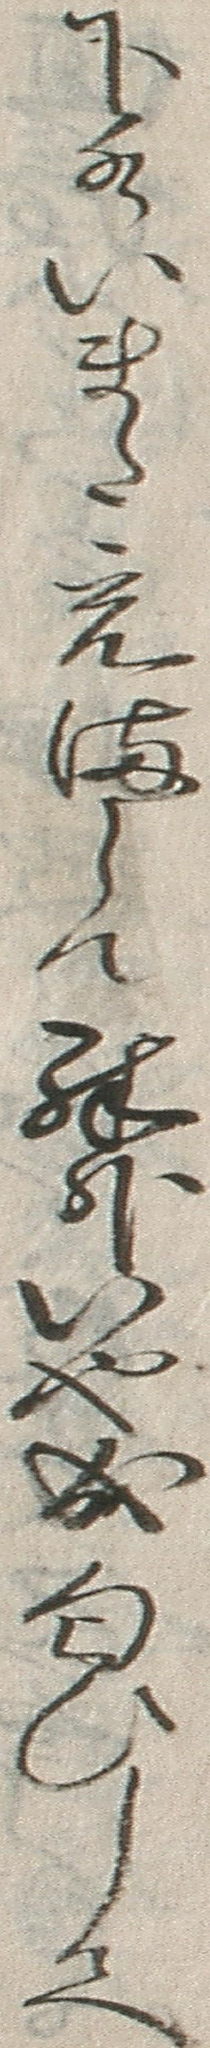下水いまた充満して殊外いや成匂ひして

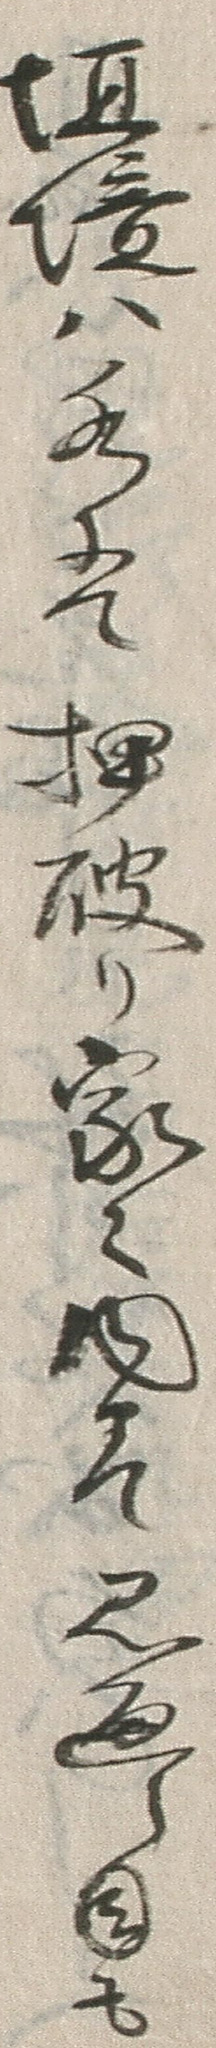垣境は水にて押破り家々内にて見通し目も
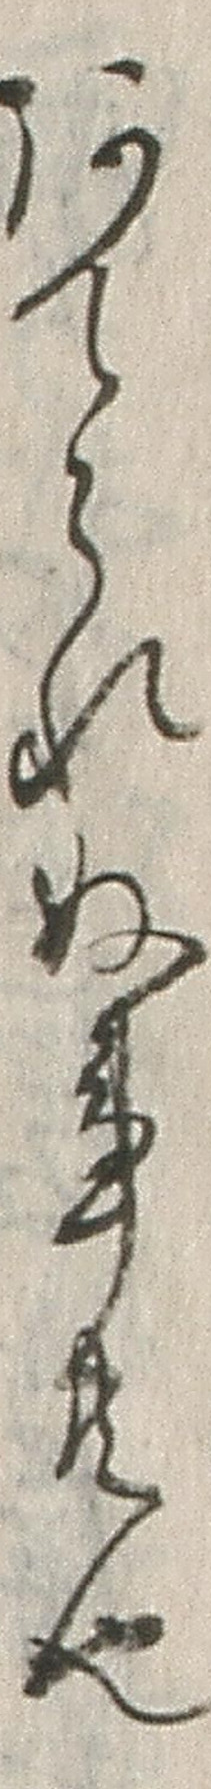あてられぬ事共也
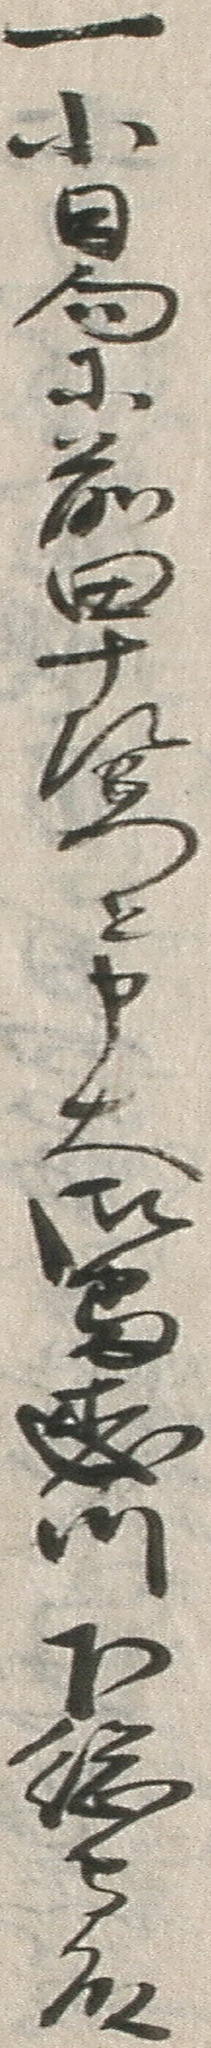一小日向に前田十左衛門と申大御番森川下総守殿
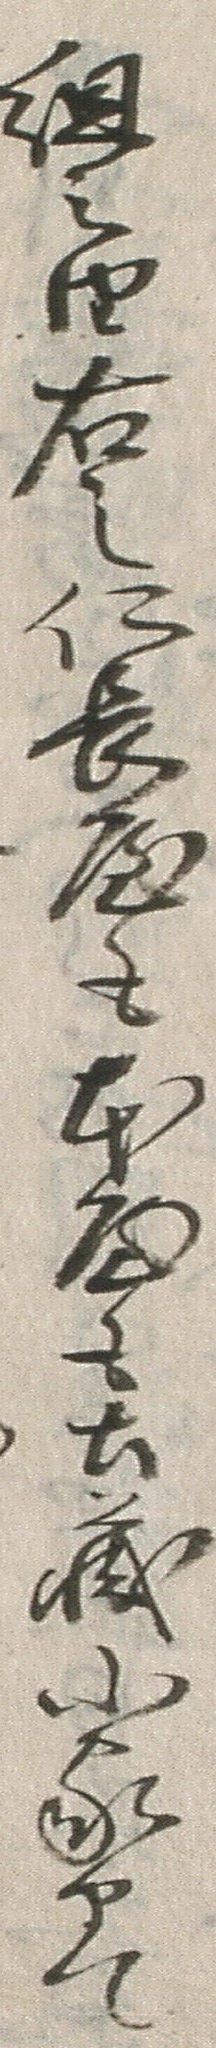組の由右之仁長屋も本屋も土蔵小家まて
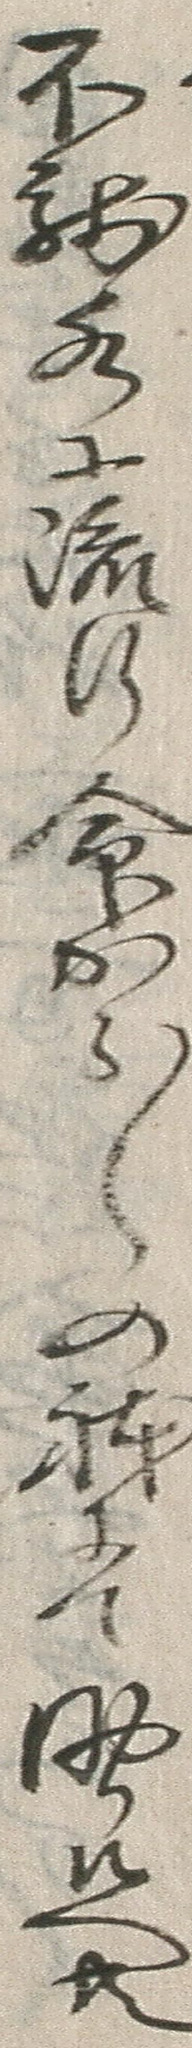不残水に流行命から〳〵の躰にて助り候へ共
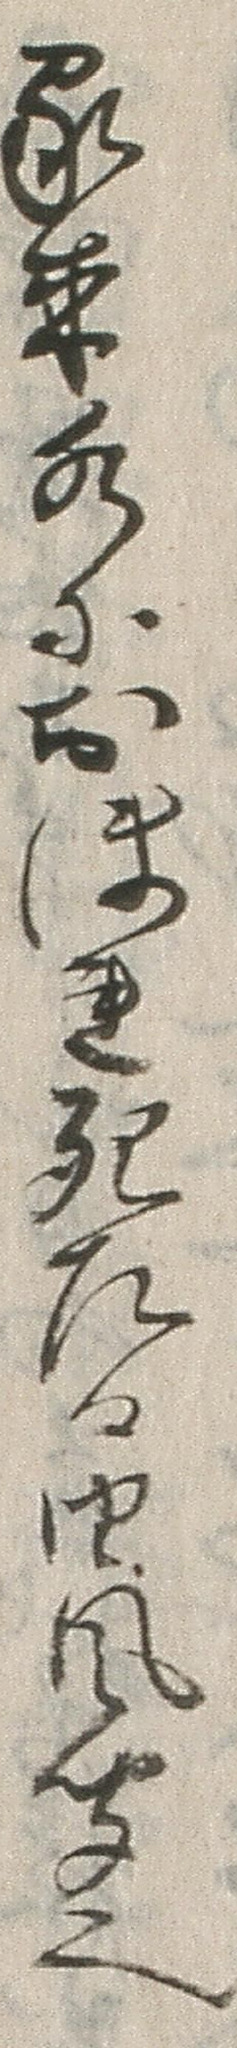家来水におほれ死たる由風聞也
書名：享保十三年江戸洪水記
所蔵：東京大学地震研究所図書室 Earthquake Research Institute Library, The University of Tokyo, JAPAN
